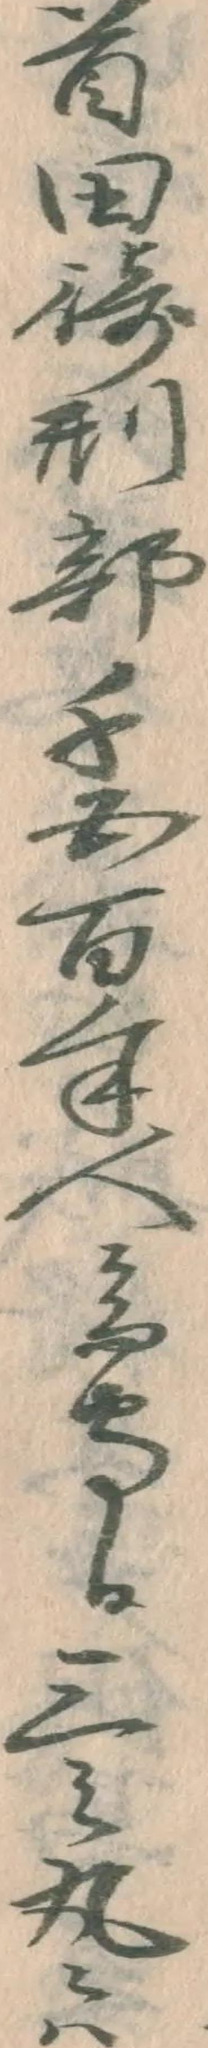首田崎刑部千五百余人に而守る三之丸には
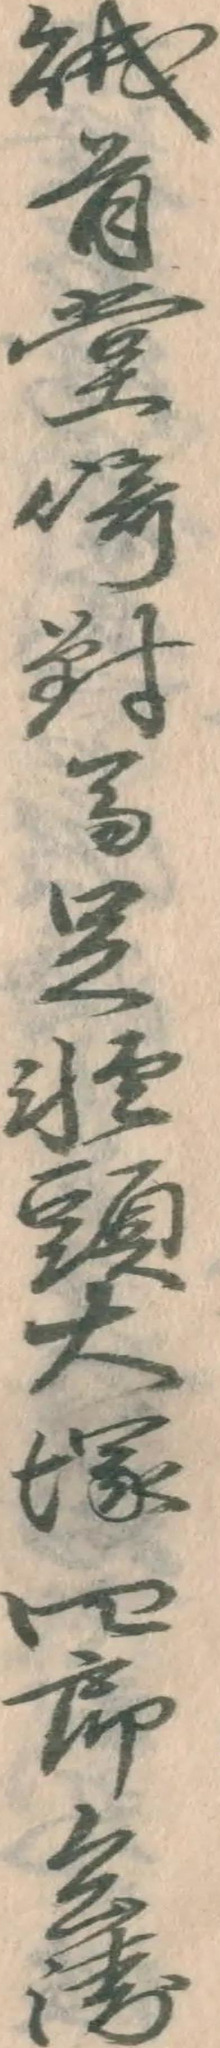賊首堂崎対馬足軽頭大塚四郎兵衛
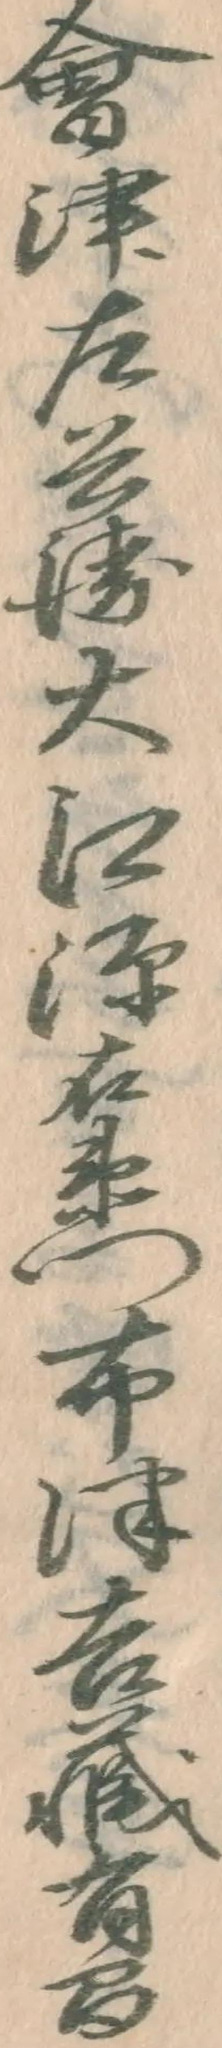会津左兵衛大江源右衛門布津吉蔵有間

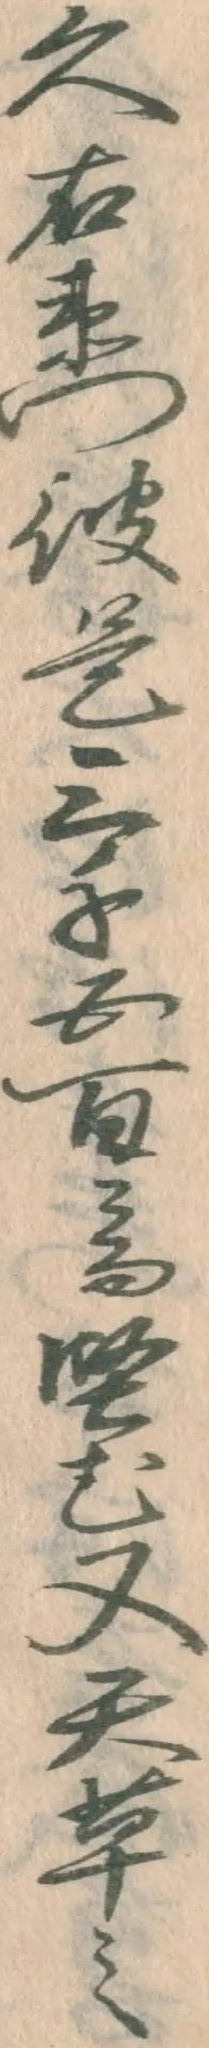久右衛門彼是三千五百に而堅む又天草之
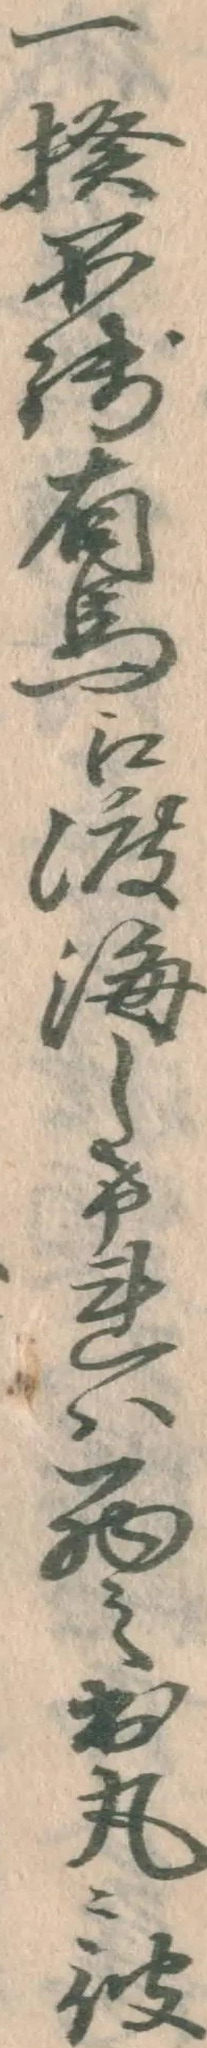一揆不残有馬江渡海し希連は西之出丸に彼
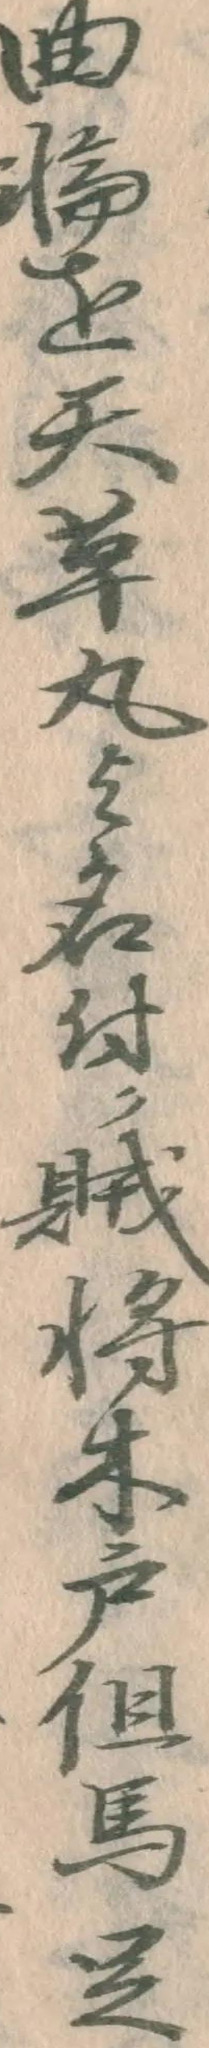曲輪を天草丸与名付く賊将木戸但馬足
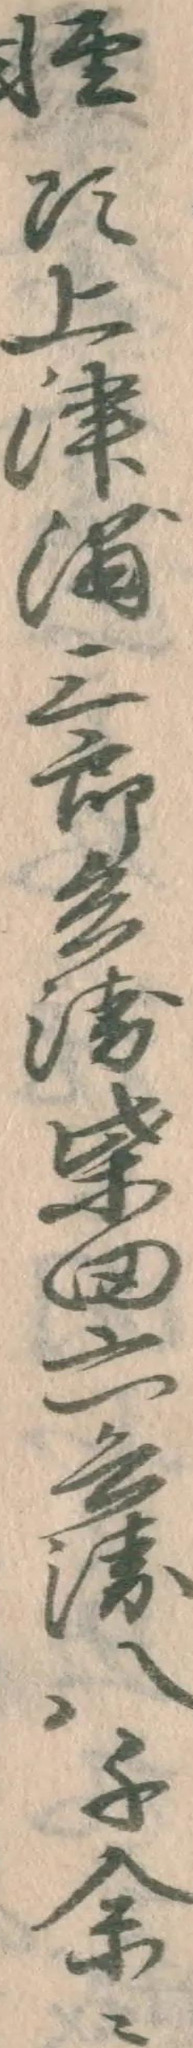軽頭上津浦三郎兵衛柴田六兵衛八千余に
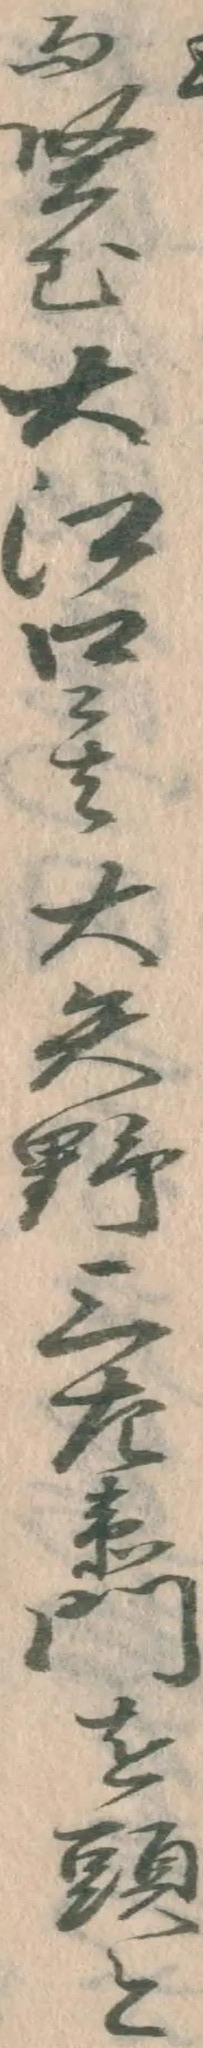而堅む大江口に者大矢野三左衛門を頭と
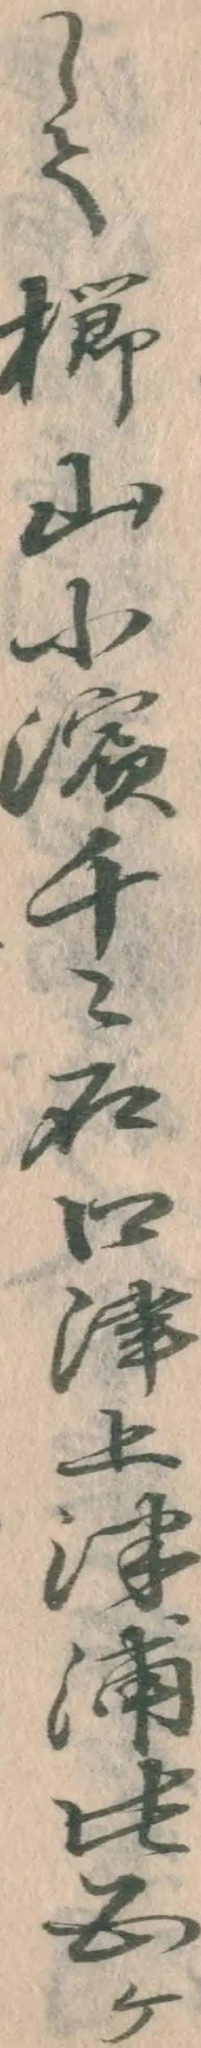して櫛山小濱千々石口津上津浦此五け
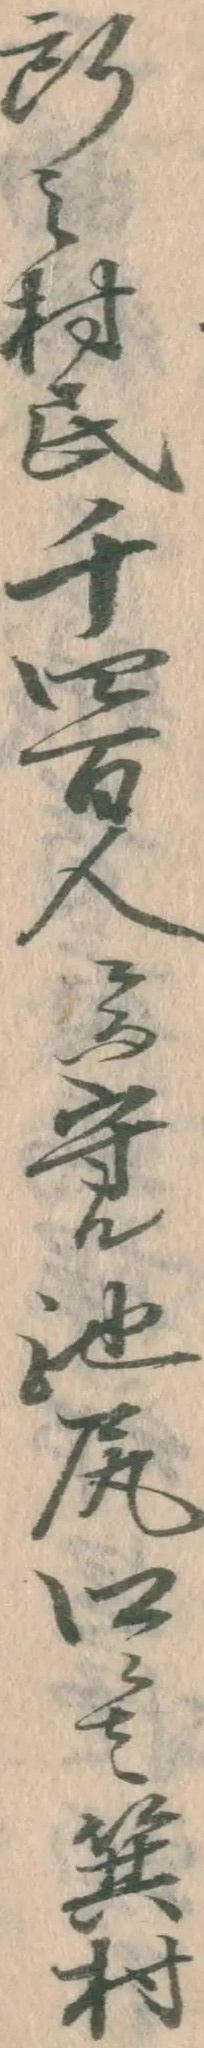所之村民千四百人に而守る池尻口に者箕村
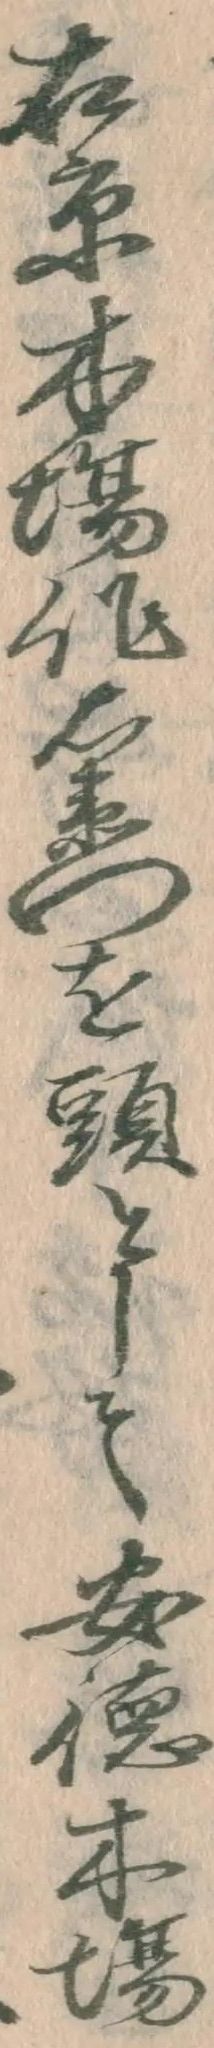右京木場作右衛門を頭として安徳木場
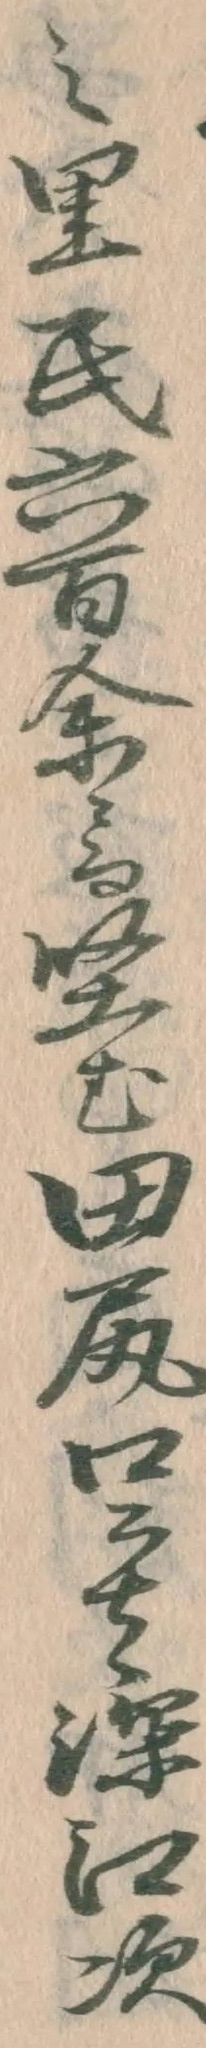之里民六百余に而堅む田尻口に者深江次
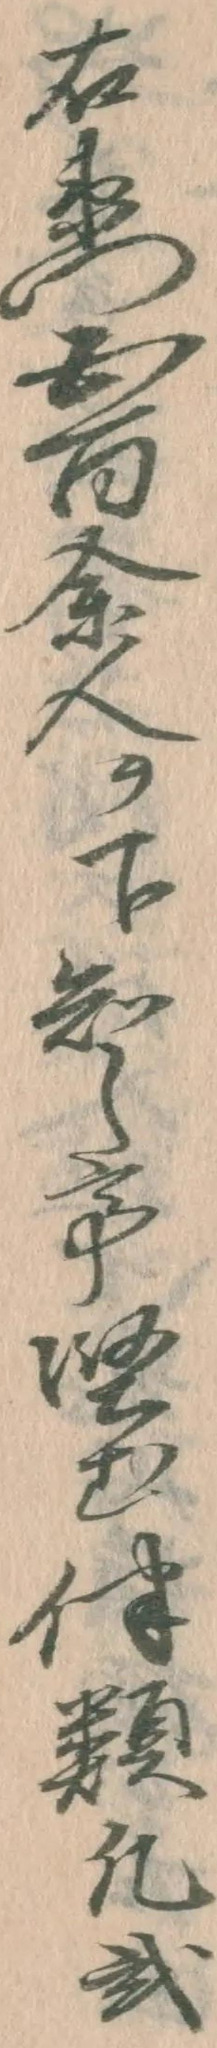右衛門五百余人を下知し亭堅む伴類凡弐
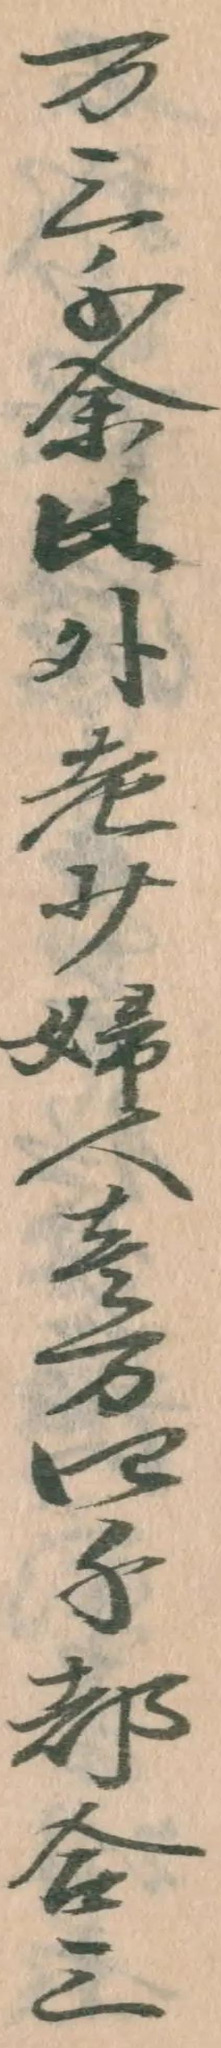万三千余此外老少婦人壱万四千都合三
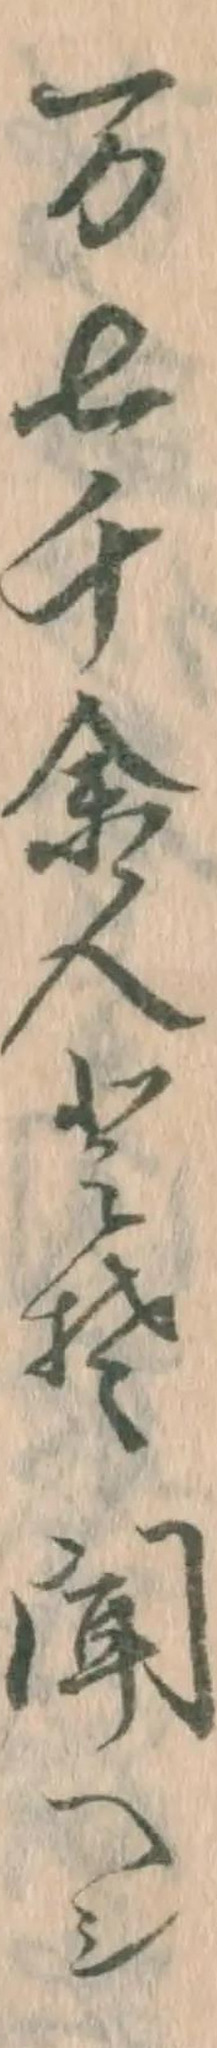万七千余人登楚聞へし
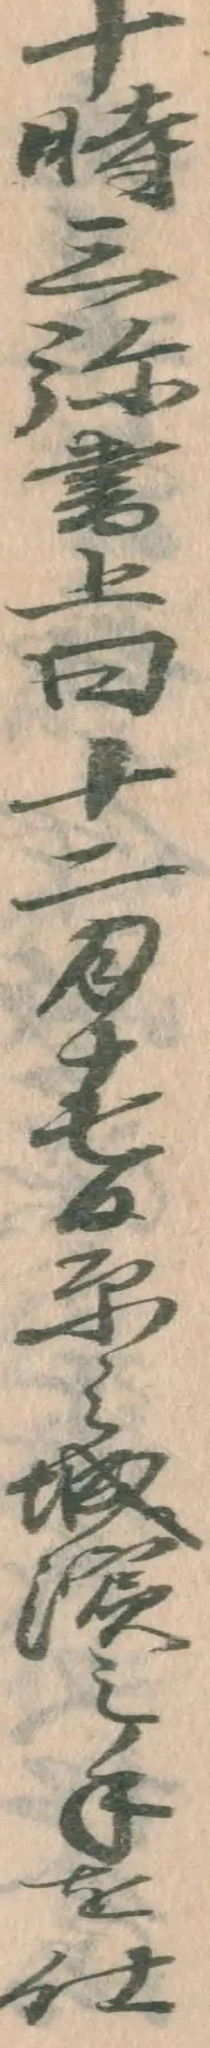十時三弥書上曰十二月十七日原之城浜之手を仕
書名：切支丹御退治記 49巻. [4]
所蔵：国立国会図書館 National Diet Library, JAPAN
